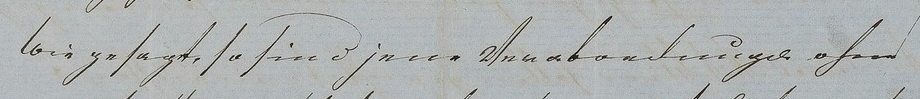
Wie gesagt, so sind jene Verabredungen ohne
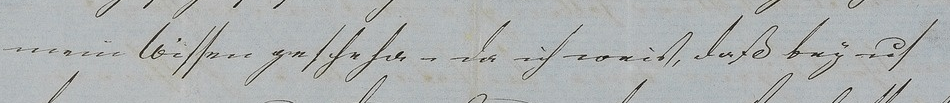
mein Wissen geschehen – Da ich weiß, daß bey unsern
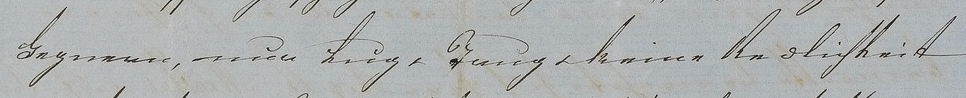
Gegnern, nur Lug & Trug & keine Redlichkeit
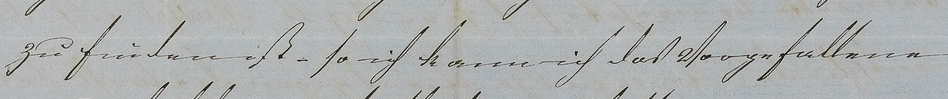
zu finden ist – so kann ich das Vorgefallene
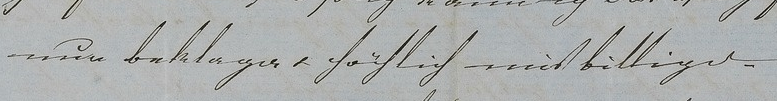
nur beklagen & höchlich mißbilligen–
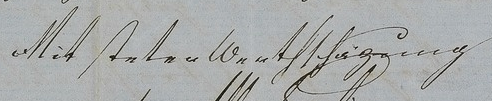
Mit steter Werthschäzung
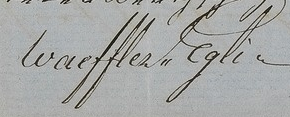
Waeffler-Egli
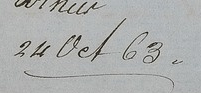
24 Oct 63.
